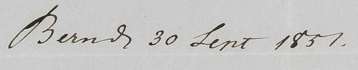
Bern den 30. Sept 1851.
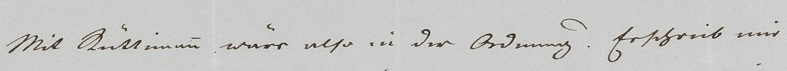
Mit Rüttimann wärs also in der Ordnung. Er schrieb mir,
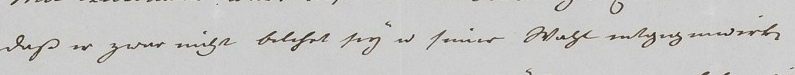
daß er zwar nicht belehrt sey u seiner Wahl entgegenwirken
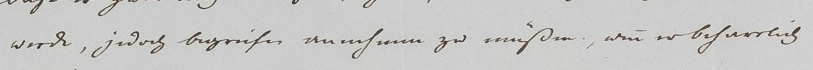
werde, jedoch begreife, annehmen zu müßen, wenn er beharrlich
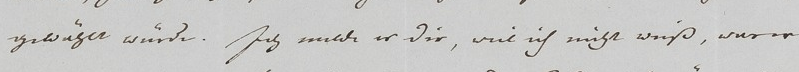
gewählt würde. Ich melde es Dir, weil ich nicht weiß, was er
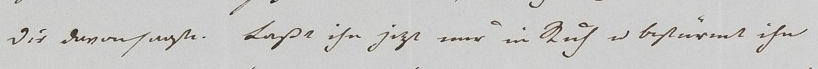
Dir davon sagte. Laßt ihn jetzt nur in Ruh u bestürmt ihn
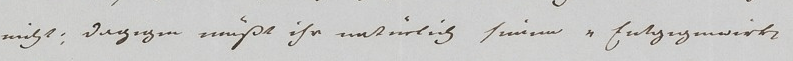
nicht; dagegen müßt ihr natürlich seinem «Entgegenwirken»
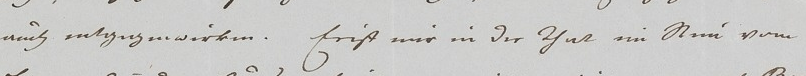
auch entgegenwirken. Es ist mir in der That ein Stein vom
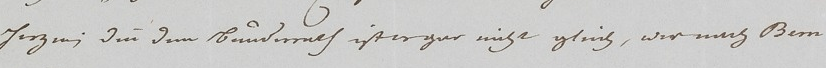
Herzen; denn dem Bundesrath ist es gar nicht gleich, wer nach Bern
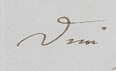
Dein
